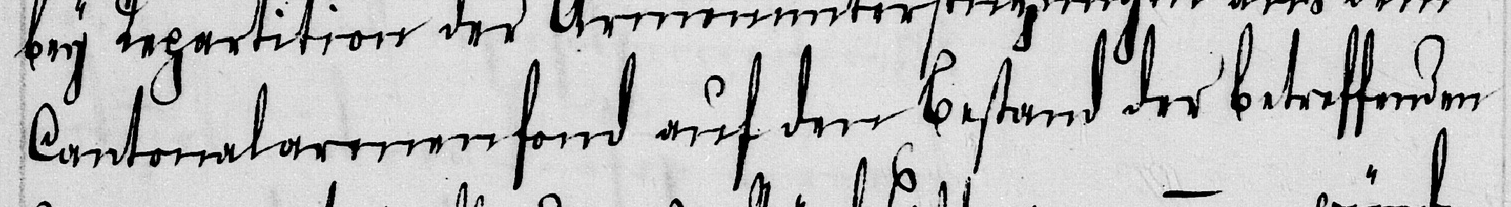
Cantonalarmenfond auf den Bestand der betreffenden
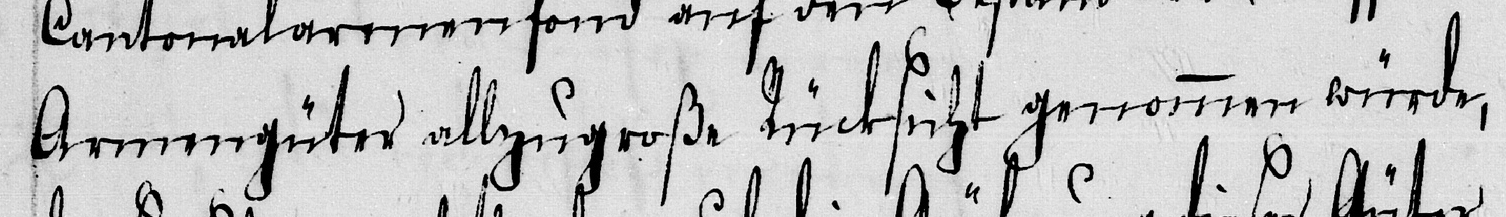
Armengüter allzugroße Rücksicht genommen würde,
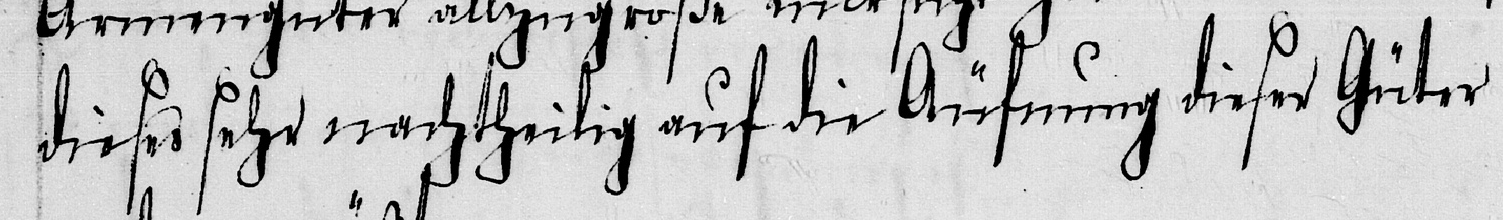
dieses sehr nachtheilig auf die Äufnung dieser Güter
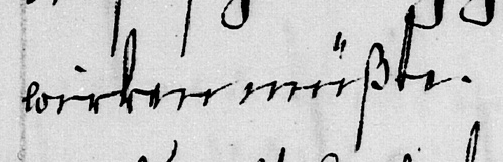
wirken müßte.
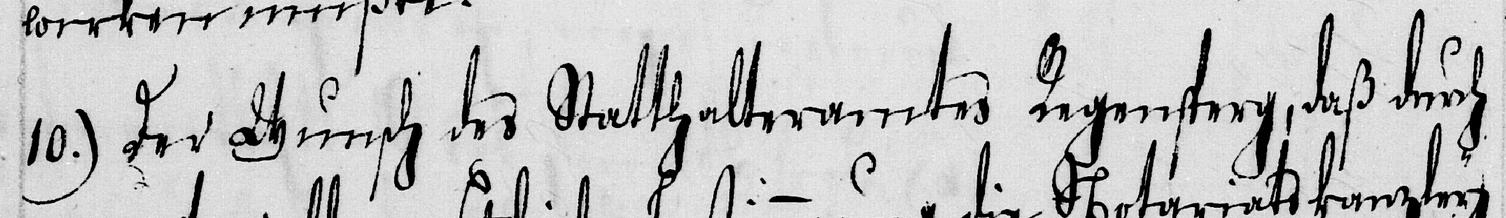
10.) Der Wunsch des Statthalteramtes Regensperg, daß durch
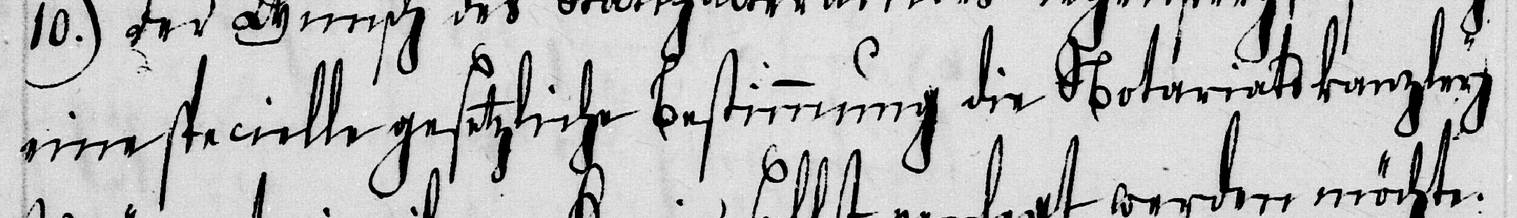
eine specielle gesetzliche Bestimmung die Notariatskanzley
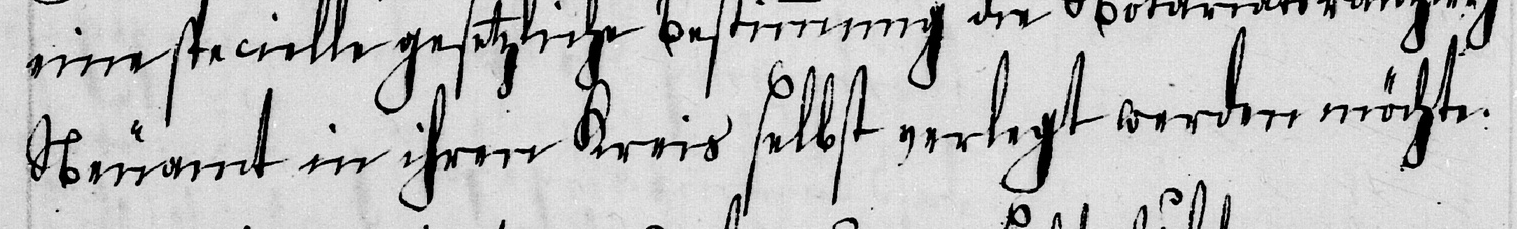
Neuamt in ihren Kreis selbst verlegt werden möchte.
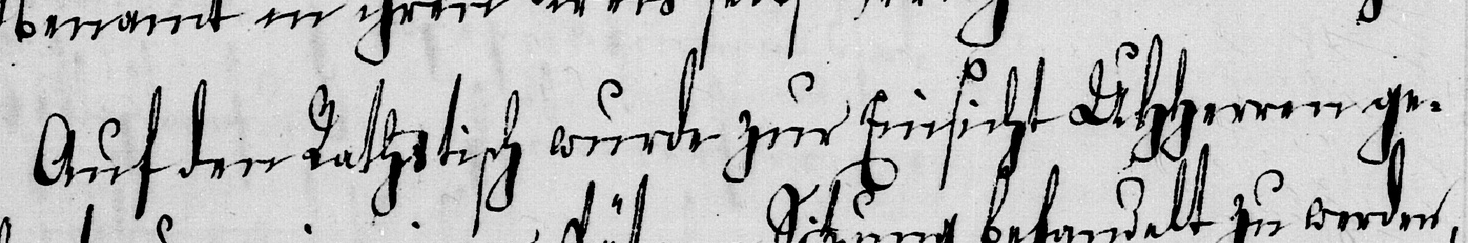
Auf den Rathstisch wurde zur Einsicht UHHerren ge¬
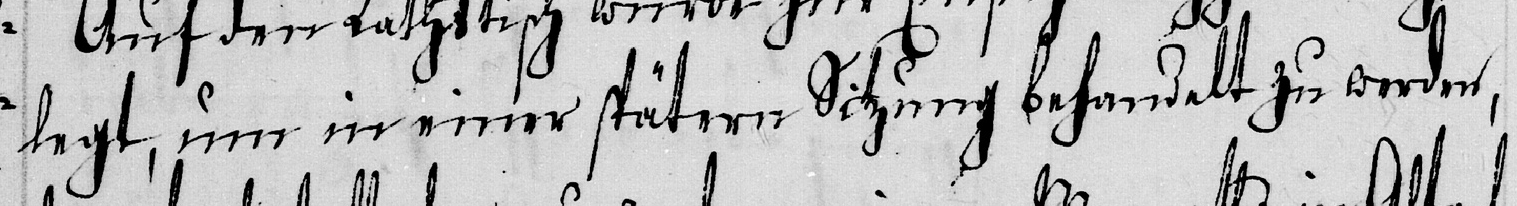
legt, um in einer spätern Sitzung behandelt zu werden,
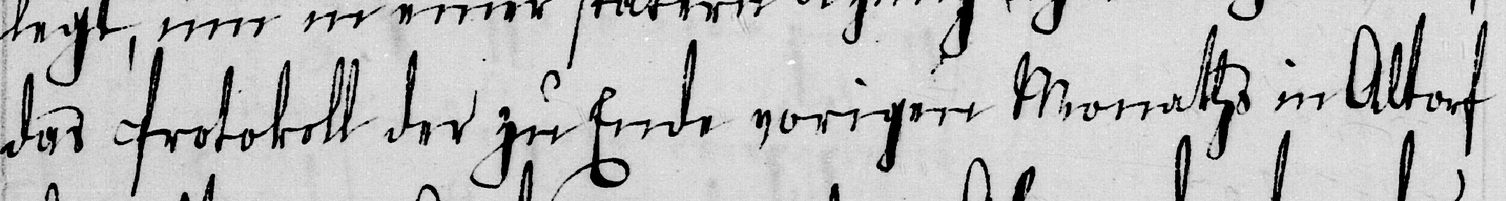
das Protokoll der zu Ende vorigen Monaths in Altorf
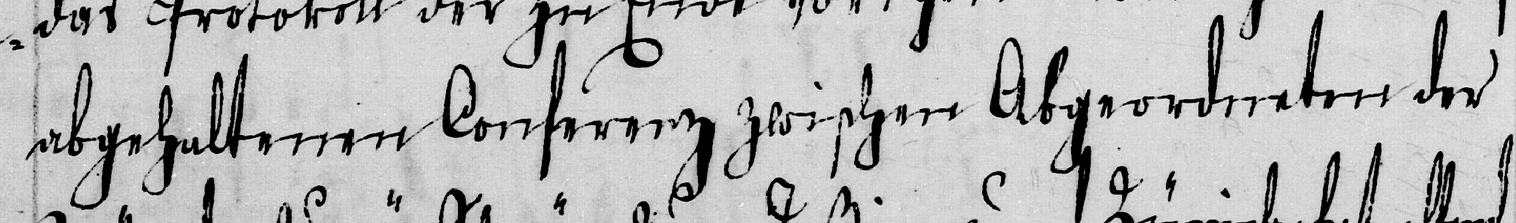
abgehaltenen Conferenz zwischen Abgeordneten der
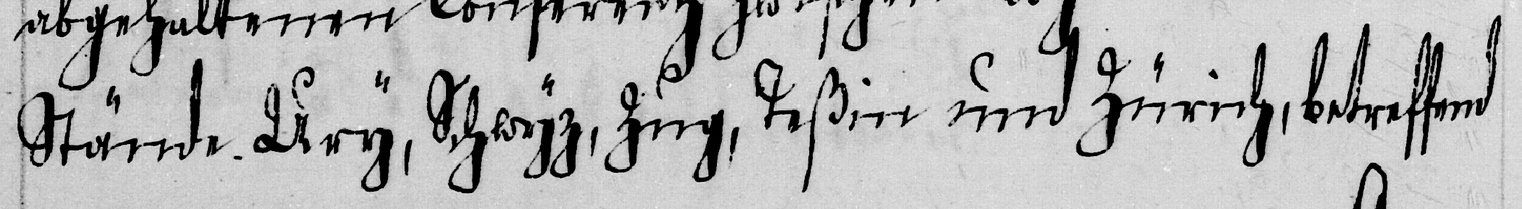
Stände Ury, Schwyz, Zug, Teßin und Zürich, betreffe¬
